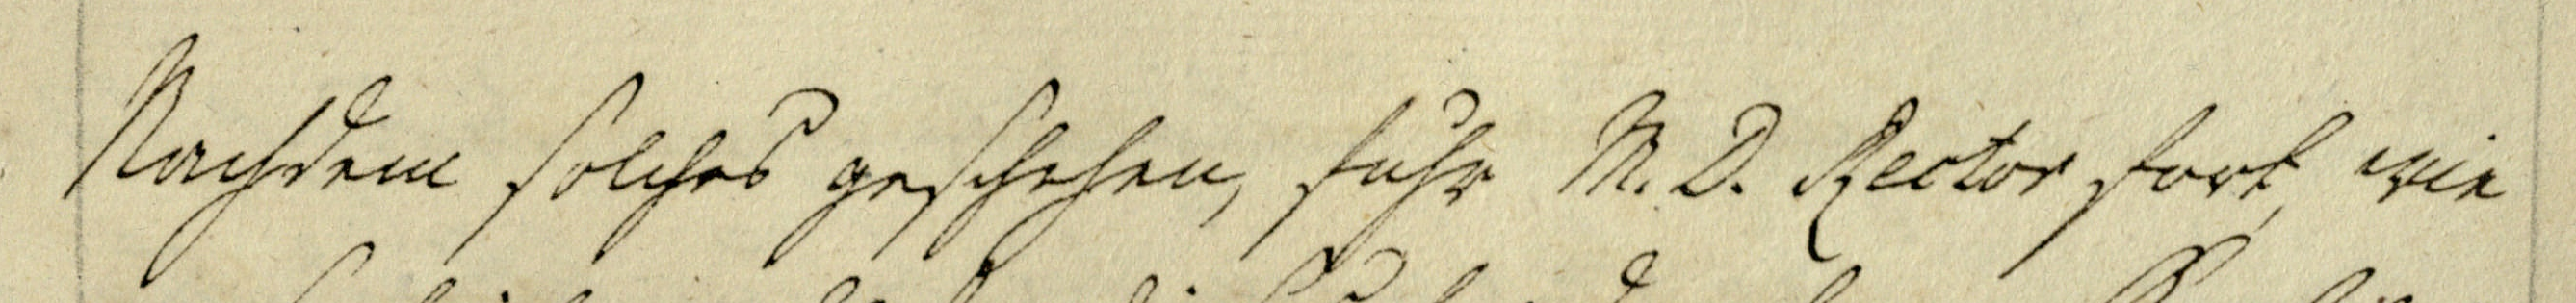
Nachdem solches geschehen, für M. D. Rector fort, wie
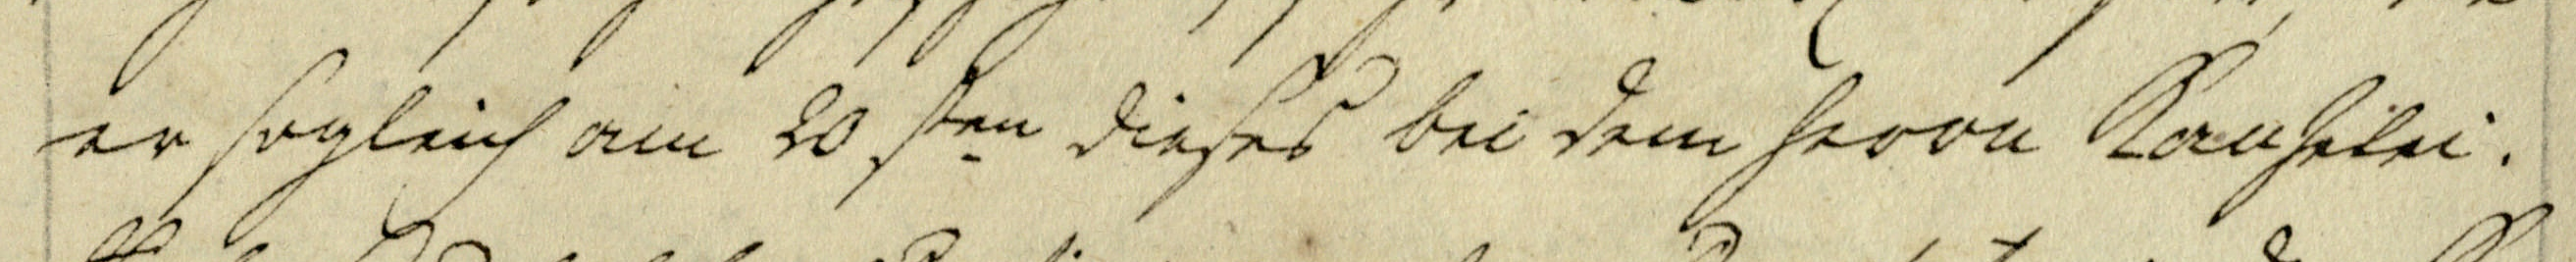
er sogleich am 20 sten dieses bei dem Herrn Kanzelei—
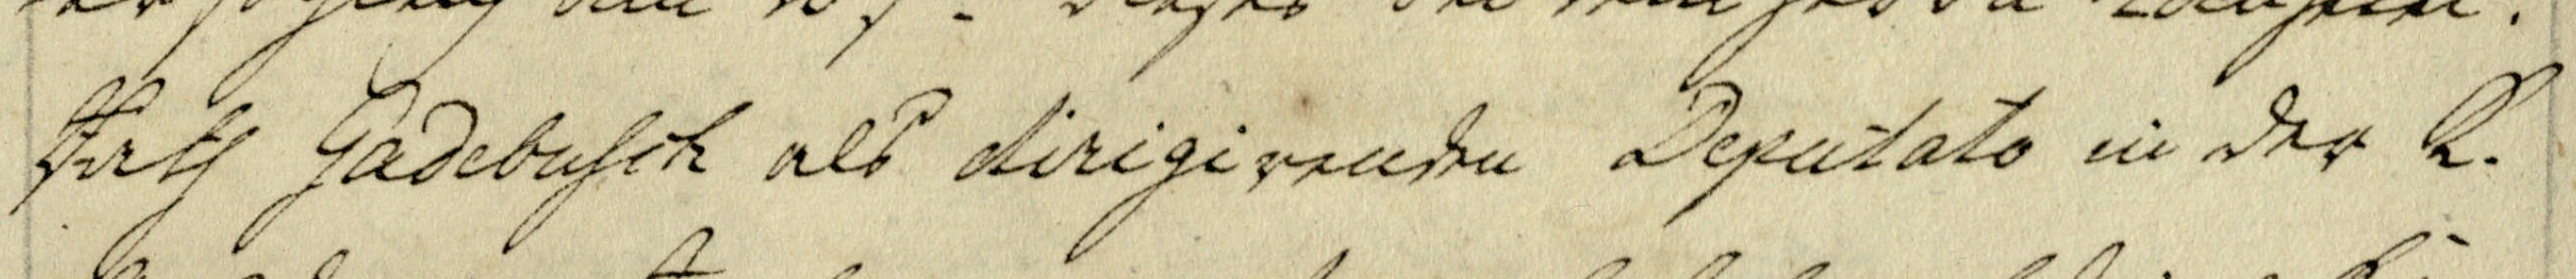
Rath Gadebusch als dirigirenden Deputato in der K.
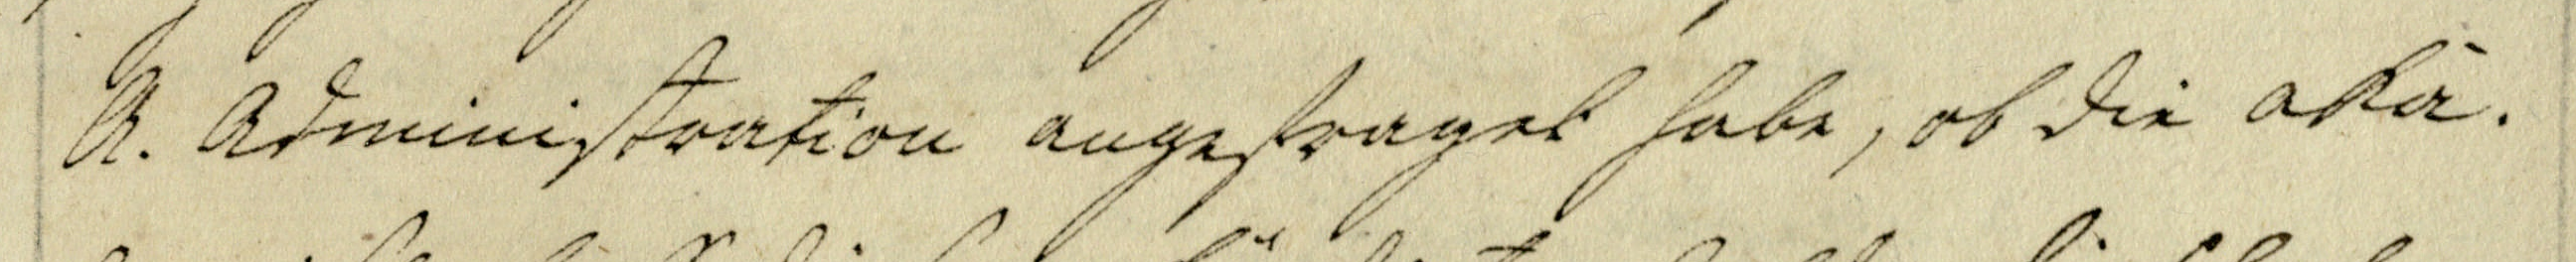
M. Administration angefraget habe, ob die aka¬
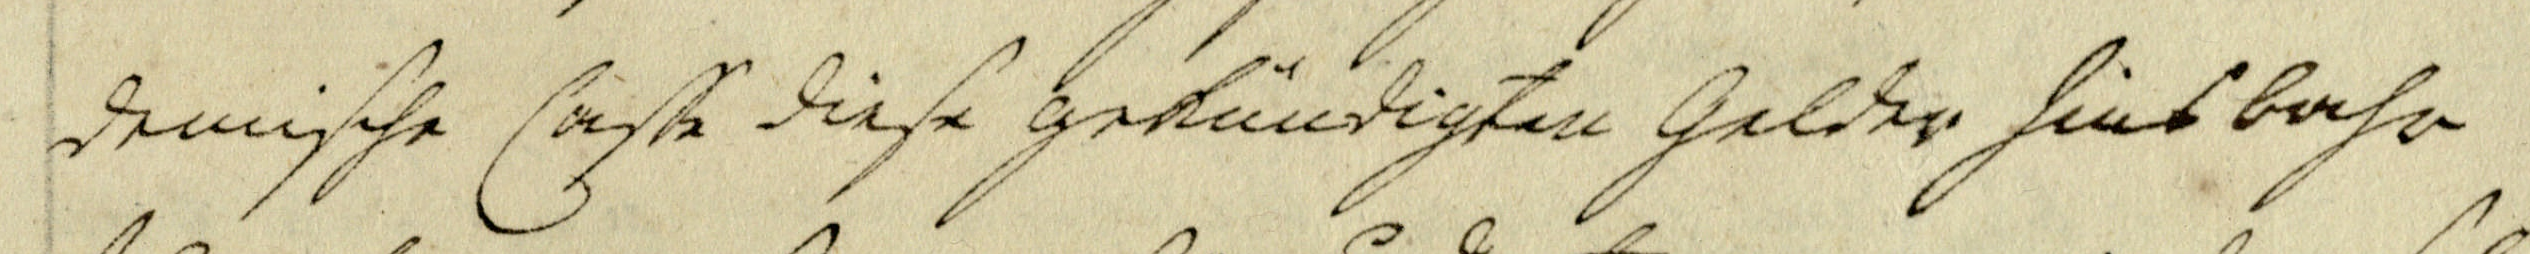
demische Casse diese gekündigten Gelder zinsbahr
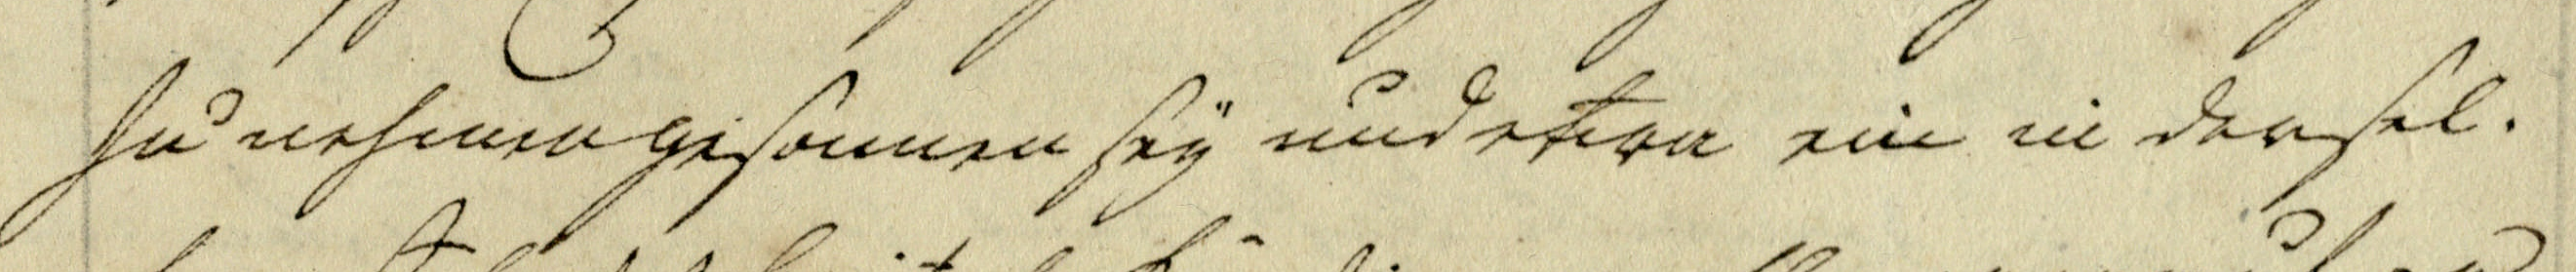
zu nehmen gesonnen seÿ und etwa ein in dersel¬
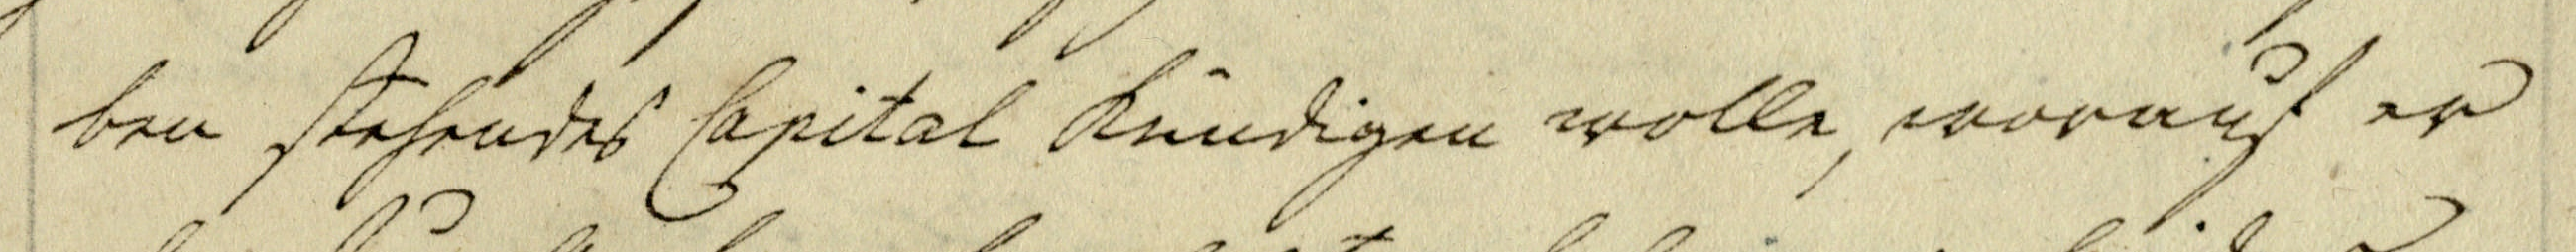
ben stehendes Capital kündigen wolle, worauf er
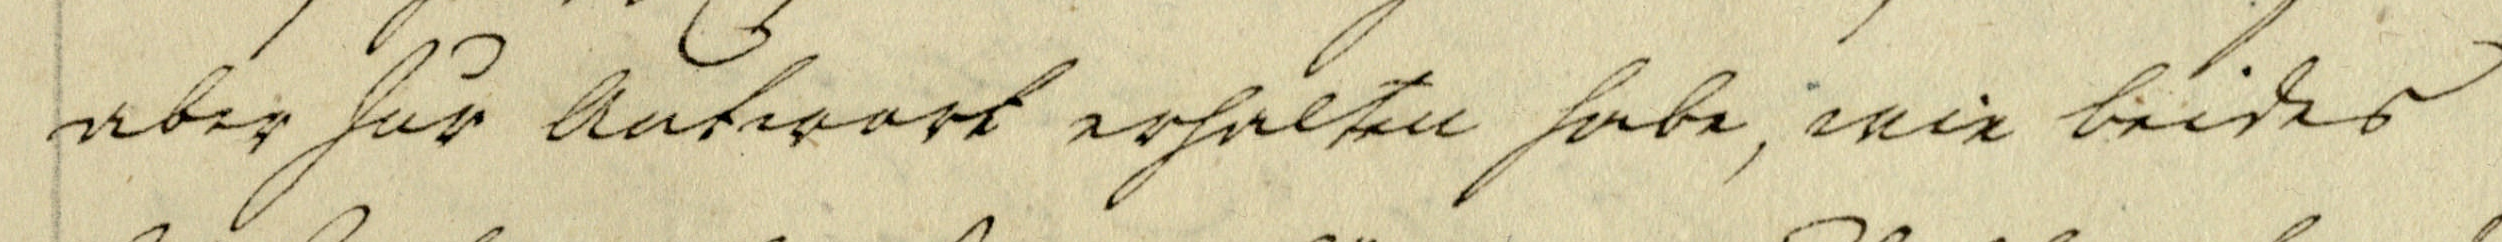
aber zur Antwort erhalten habe, wie beides
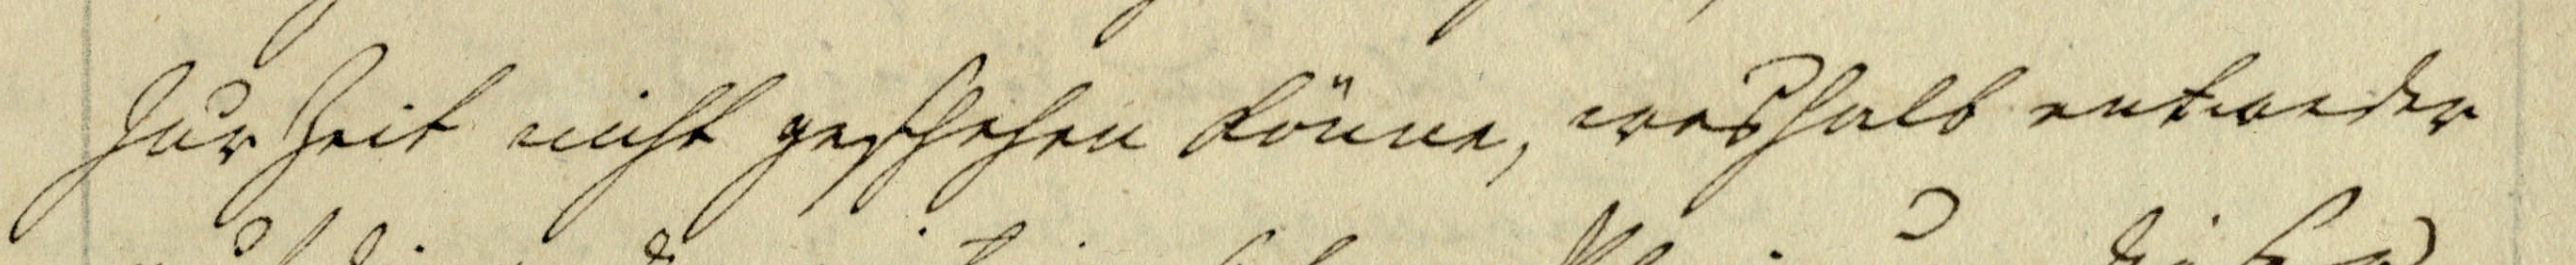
zur Zeit nicht geschehen könne, weshalb entweder
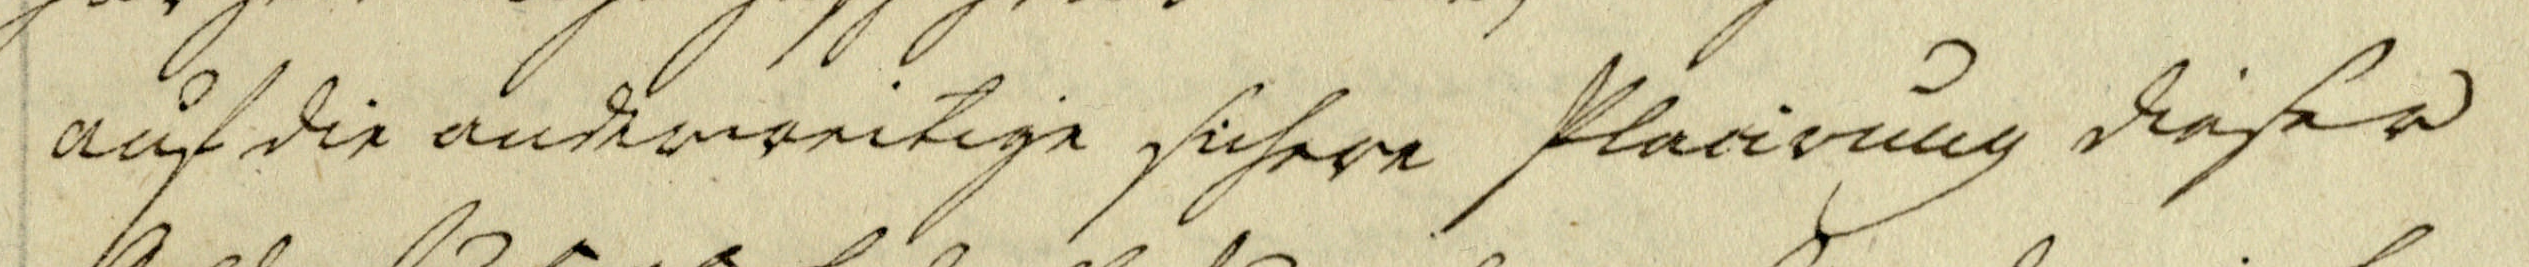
auf die anderweitige sichere Placirung dieser
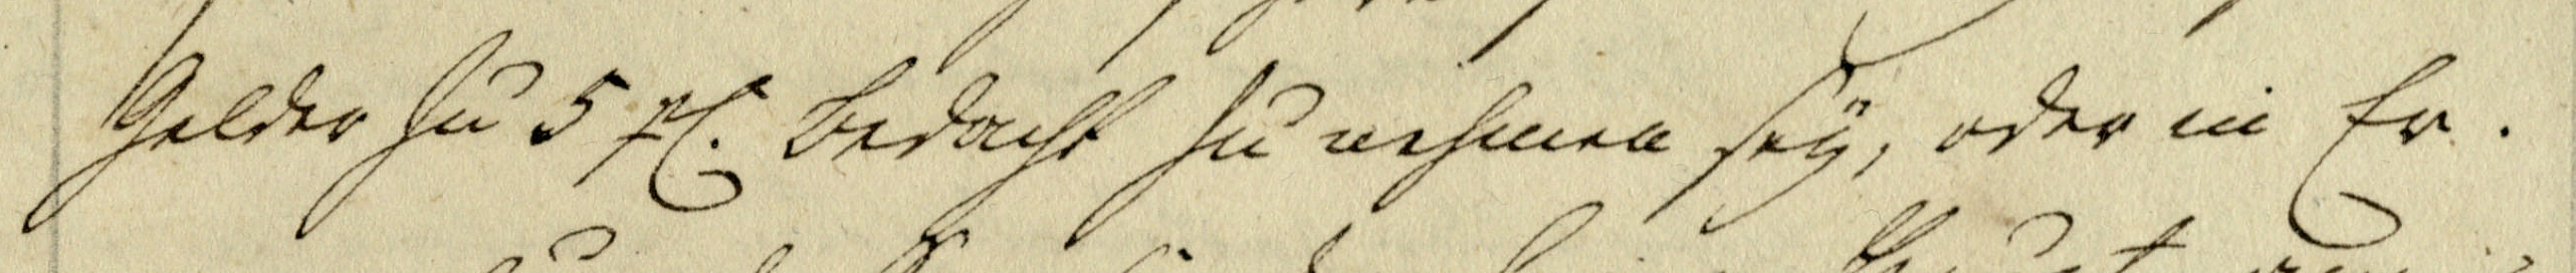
Gelder zu 5 pl. Bedacht zu nehmen seÿ, oder in Er¬
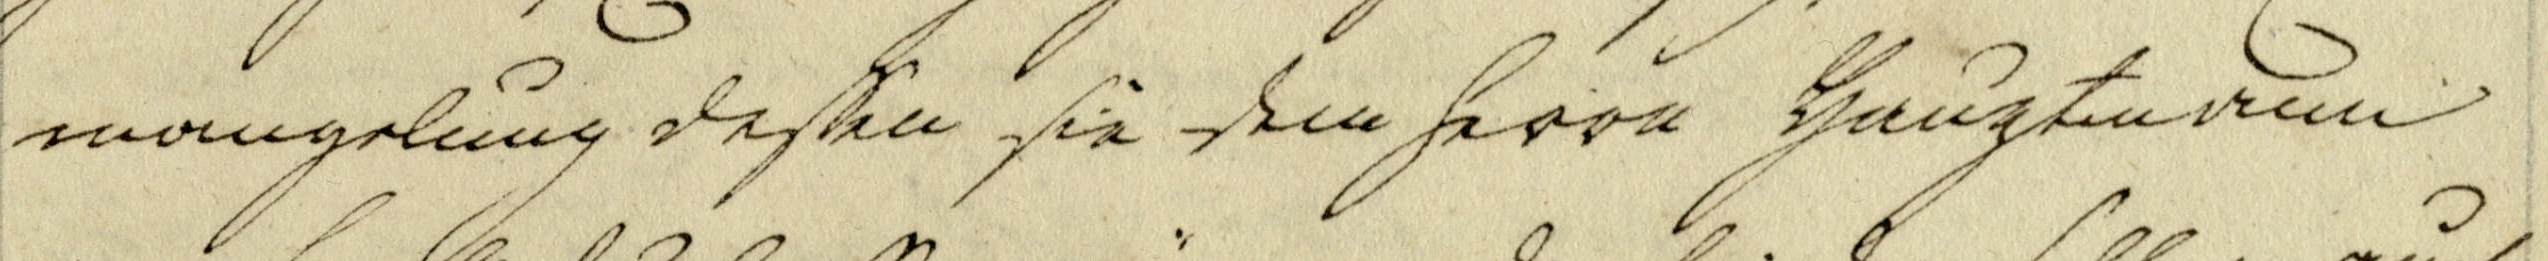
mangelung dessen sie dem Herrn Hauptmann
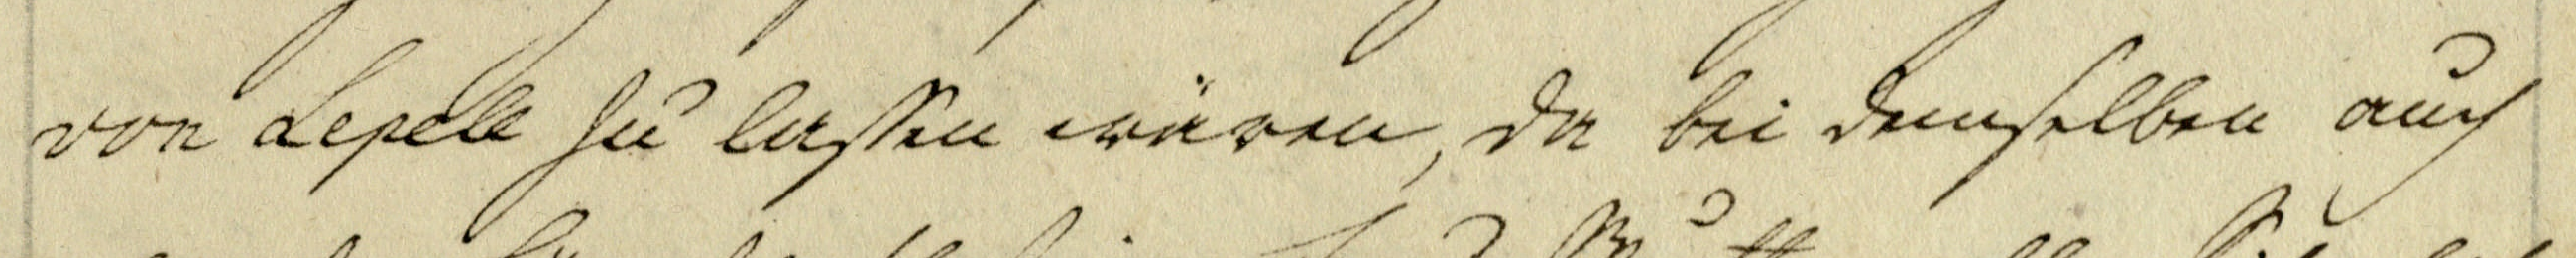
von Lepell zu lassen wären, da bei demselben auch
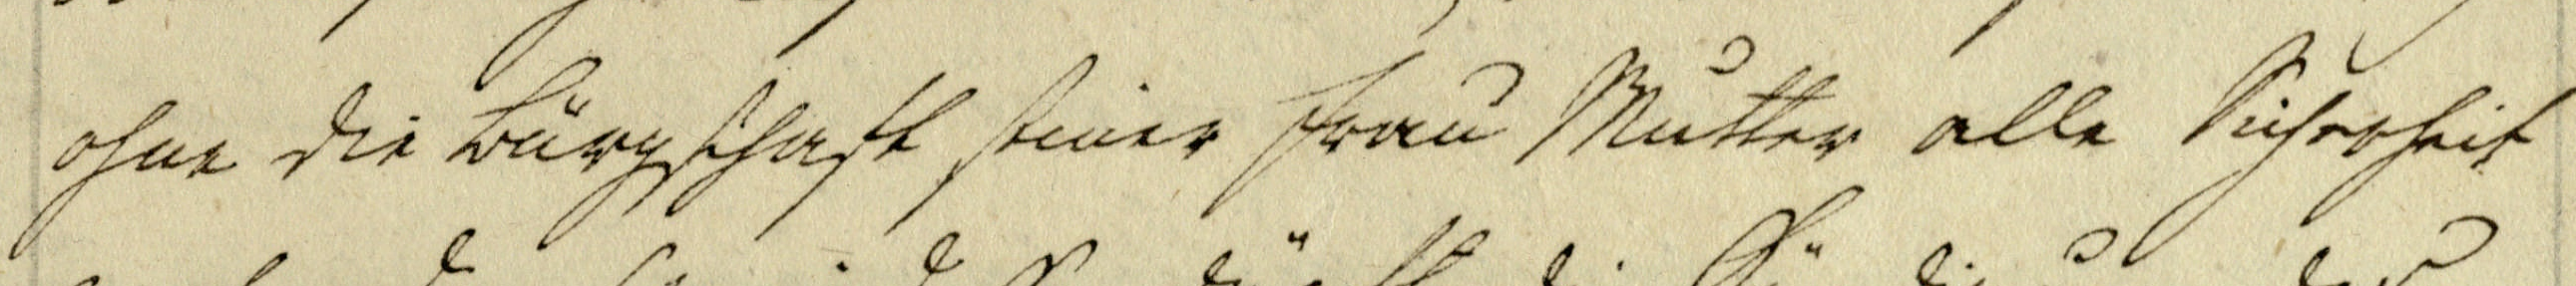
ohne die Bürgschaft seiner Frau Mutter alle Sicherheit
